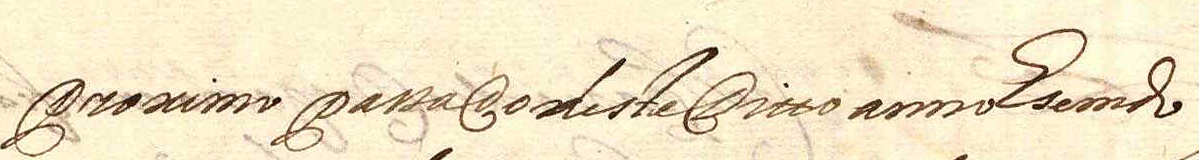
proximo passado deste ditto anno E sendo
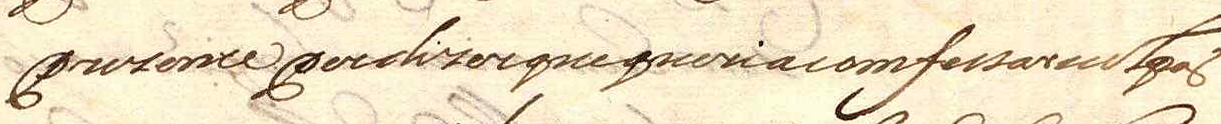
prezente por dizer que queria comfessar culpas
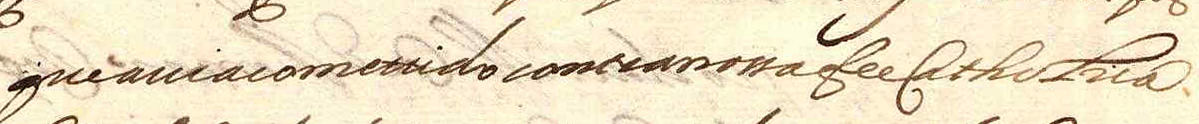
que auia comettido contra nossa fee Catholica
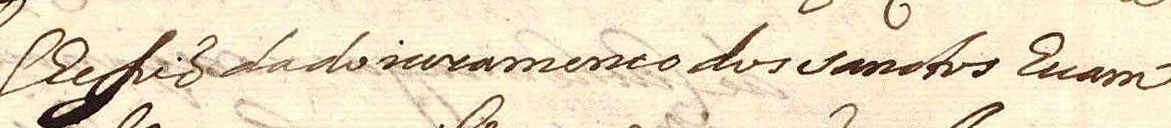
lhe foi dado iuramento dos sanctos Euam
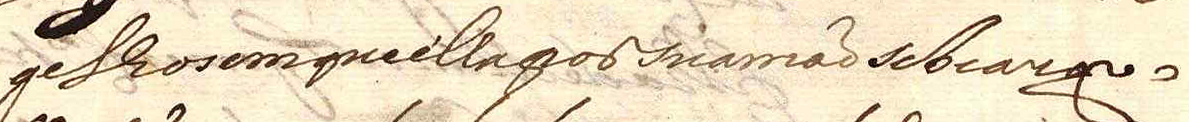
gelhos em que ella pos sua maõ sob cargo
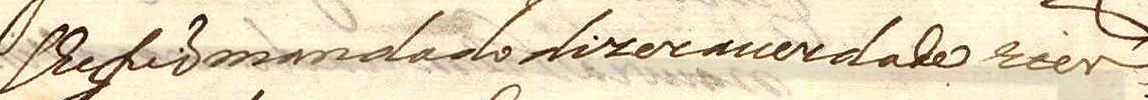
lhe foi mandado dizer a uerdade E ter
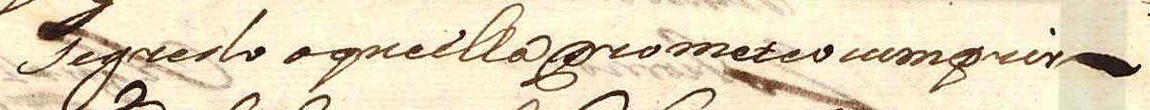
segredo o que ella prometeo cumprir
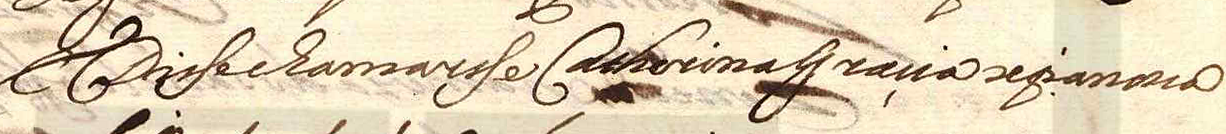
E Disse chamarse Catherina Gracia xpa noua
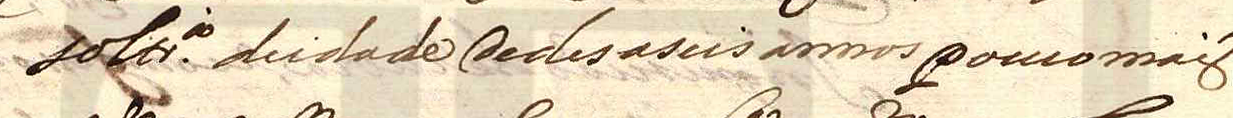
soltr.a de idade de desaseis annos pouco mais
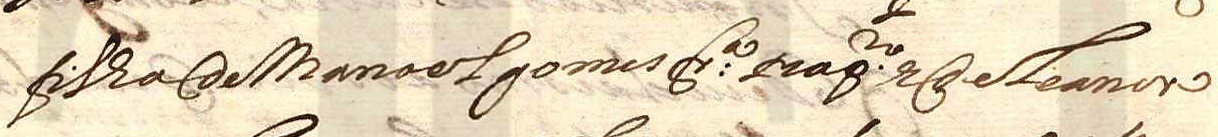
filha de Manoel gomes fr.a trap.ro E de Leanor
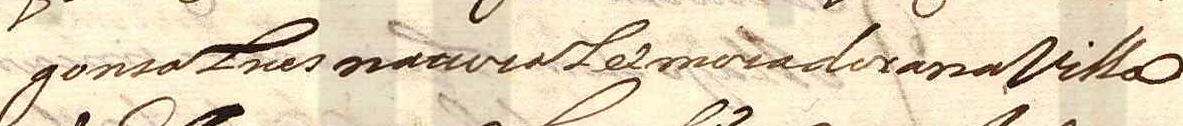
gonsalues natural e moradora na Villa
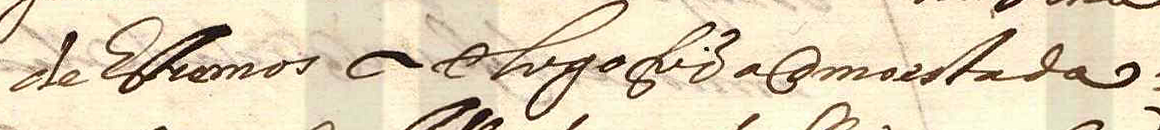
de Estremos e logo foi admoestada
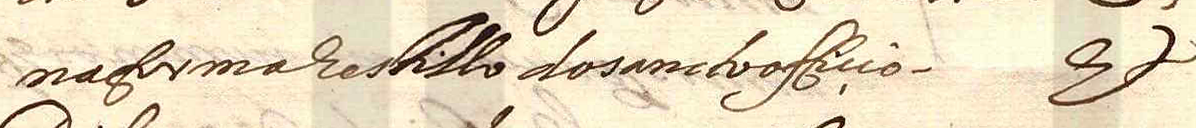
na forma E estillo do sancto officio. E
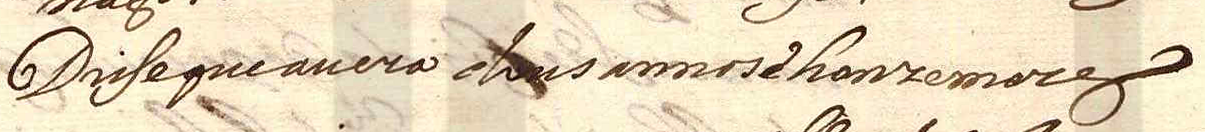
Disse que auera dous annos e honze mezes
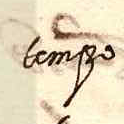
tempo
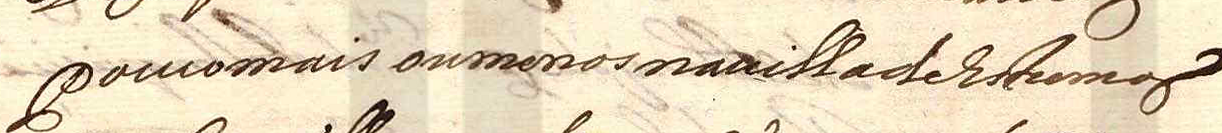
pouco mais ou menos na uilla de Estremos
